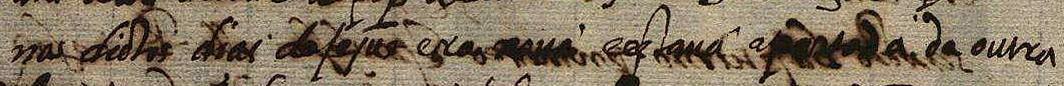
nos dictos dias de Jejūs era noua e estaua apartada da outra
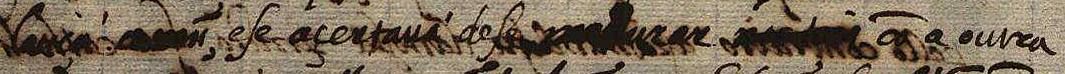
louça comū, e se açertaua de se mesturar _ cō a outra
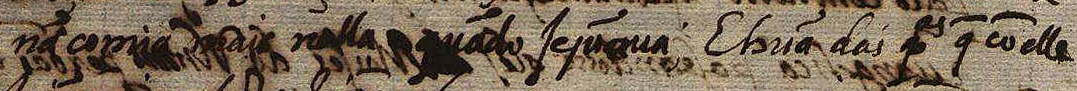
nā comiā mais nella quādo Jejūaua, E huā das pas q̄ cō elle
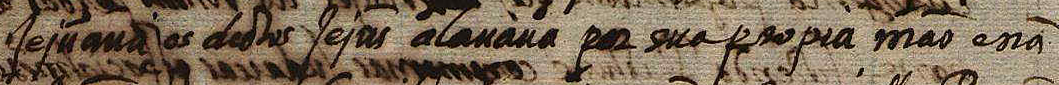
Jejūaua os dictos Jejūs a lauaua por sua propia mão e nā
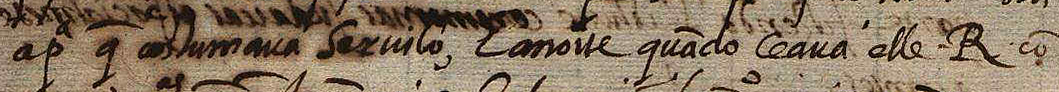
a pa q̄ costumaua seruilo, E a noite quādo ceaua elle R. cō
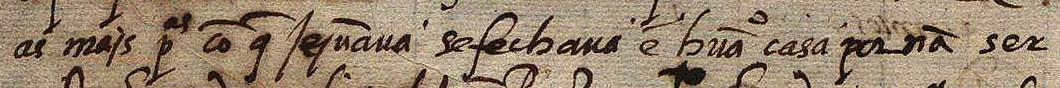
as majs pas cō q̄ Jejūaua se fechaua ē hūa casa por nā ser
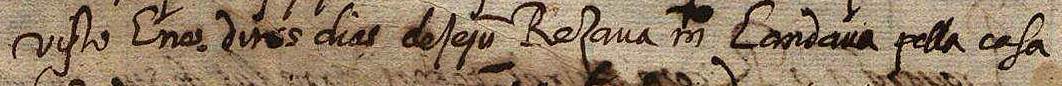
visto E nos ditos dias de Jejū Rezaua mto E andaua pella casa
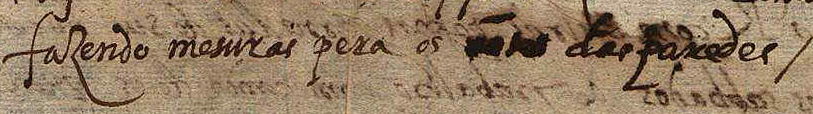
fazendo mesuras pera os cātos das paredes /
